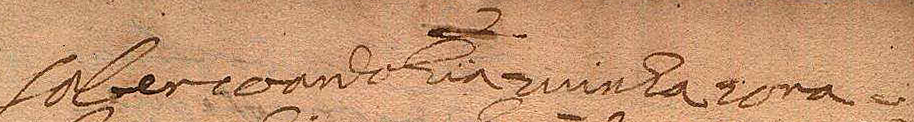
saber coando hia E uinha E ora
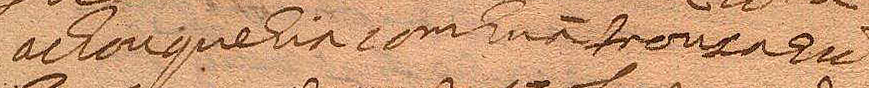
achou que hia com huā trousa hū
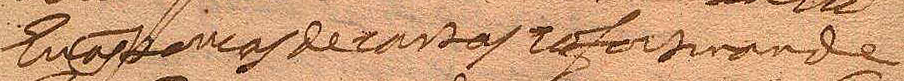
huās poucas de cartas E o foi tirou de
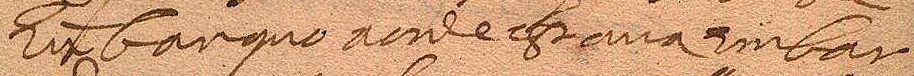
hū barquo aonde estaua Embar
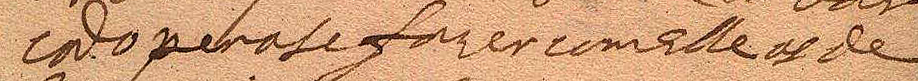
cado pera se fazer com Elle as de
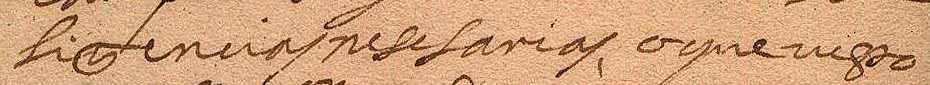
ligencias nesesarias o que uisto
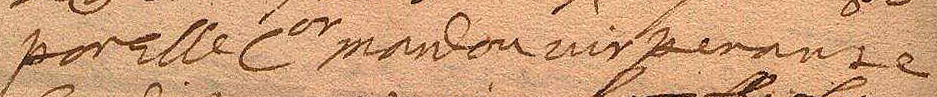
por Elle Cor mandou uir perante
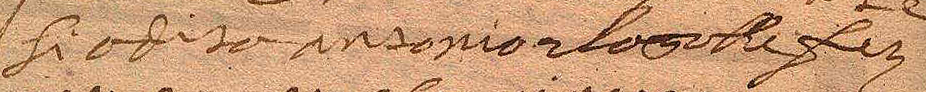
si o dito antonio E logo lhe fez
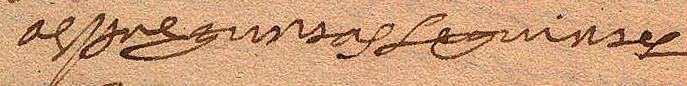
as preguntas seguintes
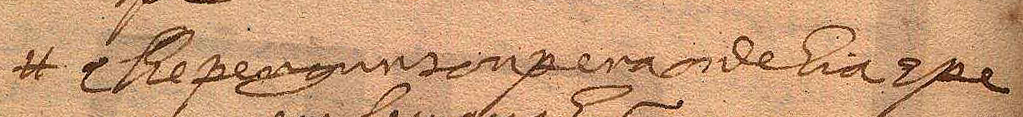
item e lhe perguntou pera onde hia E pe
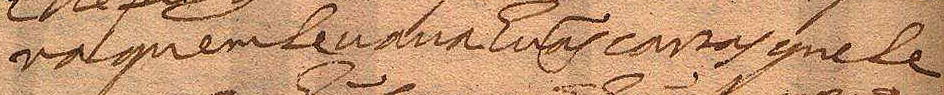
ra quem leuaua huās cartas que le
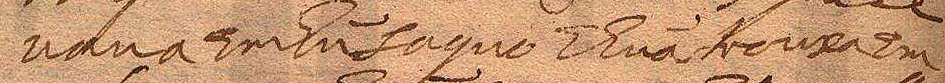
uaua Em hū saquo E huā trouxa Em
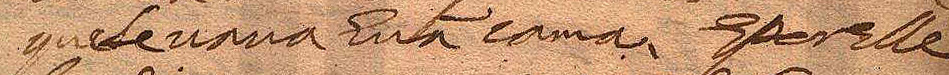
que leuaua huā cama. E por Elle
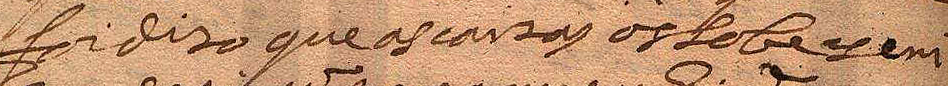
foi dito que as cartas os sabe escri
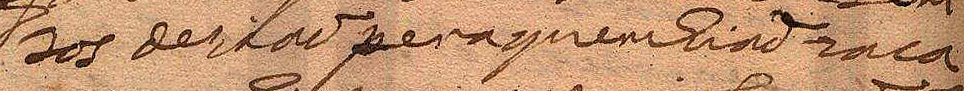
tos deziaõ pera quem hiaõ E a ca
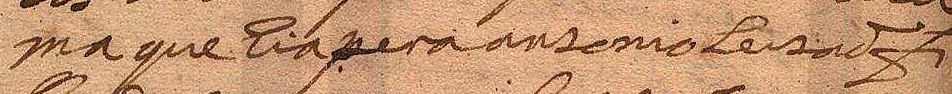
ma que hia pera antonio Leitaõ fi
